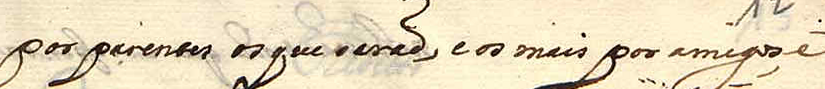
por parentes os que o eraõ, e os mais por amigos, e
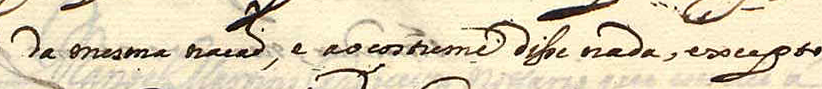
da mesma nacaõ, e ao costume disse nada, excepto
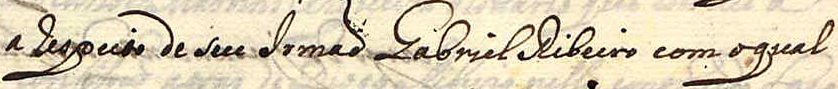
a Respeito de seu Irmaõ Gabriel Ribeiro com o qual
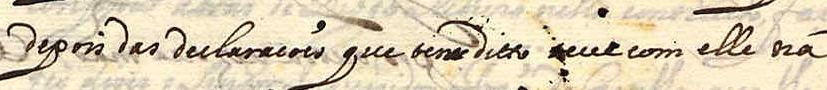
depois das declaracões que te_ ditto teue com elle na
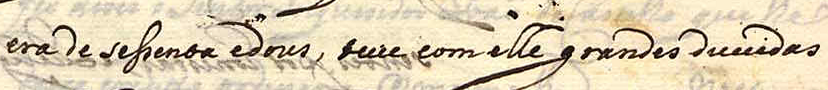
era de sessenta e dous, teue com elle grandes duuidas
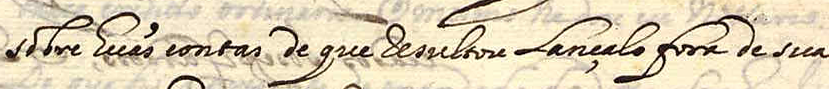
sobre huās contas de que Resultou Lançalo fora de sua
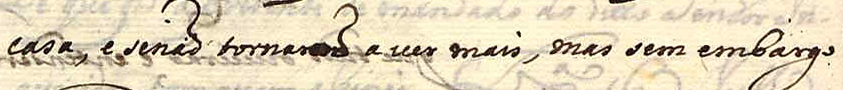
casa, e senaõ tornar_õ a uer mais, mas sem embargo
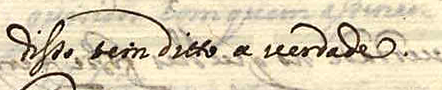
disso tem ditto a uerdade.
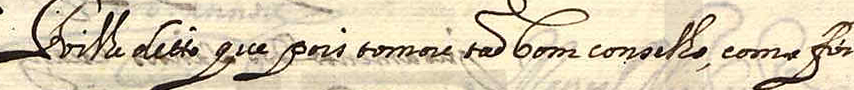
Foilhe ditto que pois tomou taõ bom conselho, como foi
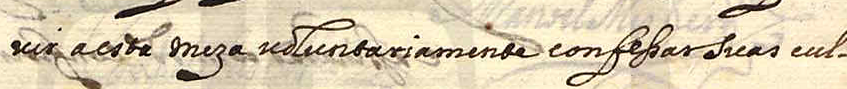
uir a esta meza uoluntariamente confessar suas cul
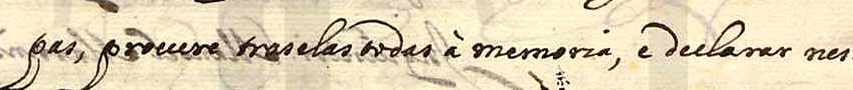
pas, procure traselas todas à memoria, e declarar nes
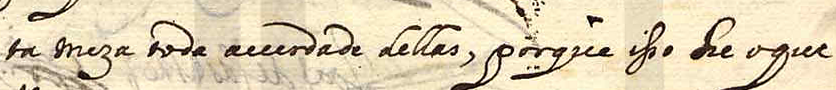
ta meza toda a uerdade dellas, porque isso he o que
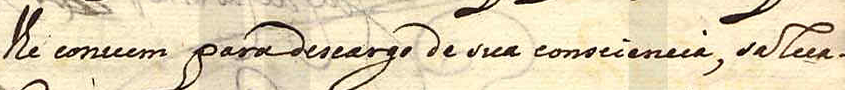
lhe conuem para descargo de sua consciencia, salua
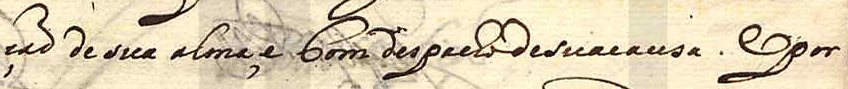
çaõ de sua alma, e bom despacho de sua causa. E por
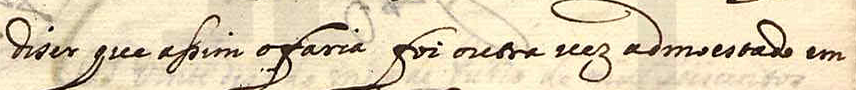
diser que assim o faria foi outra uez admoestado em
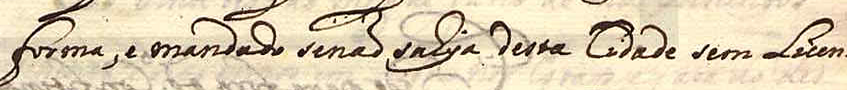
forma, e mandado se naõ sahya desta Cidade sem Licen
